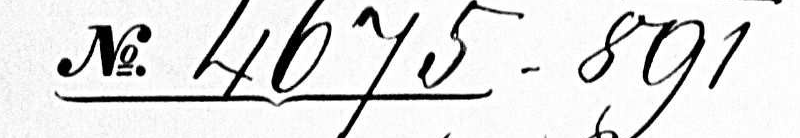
No. 4675 - 1891
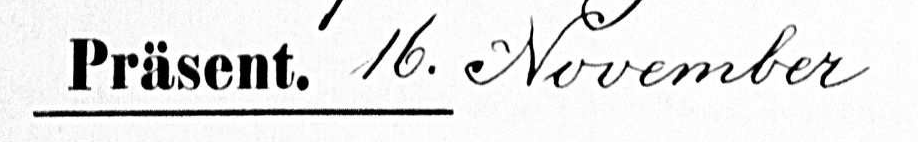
Präsent. 16. November
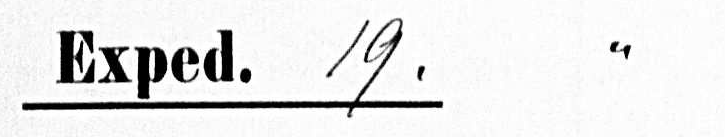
Exped. 19. „
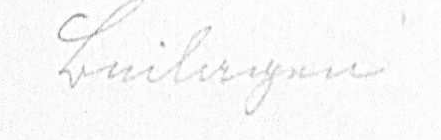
Beilagen
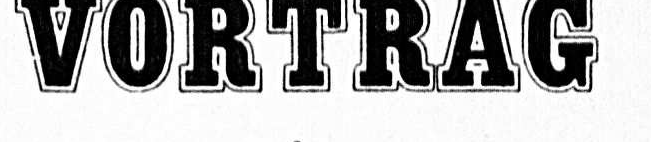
VORTRAG
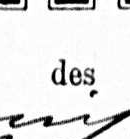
des
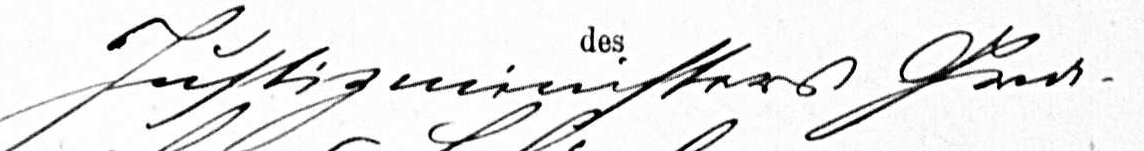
Justizministers Gra¬
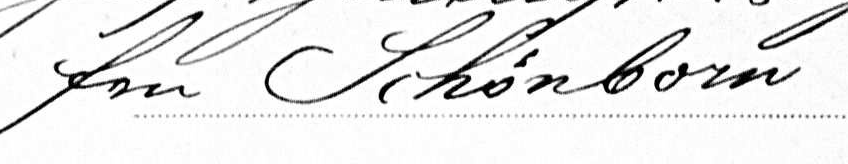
fen Schönborn
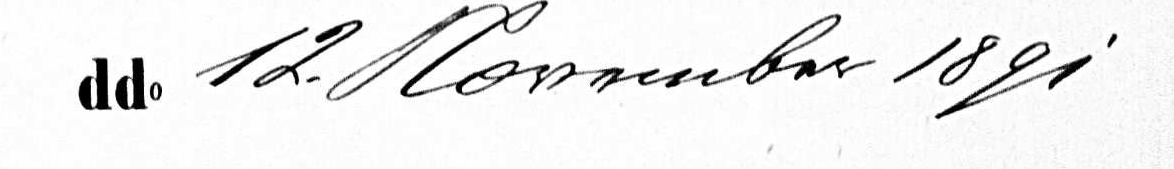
ddo 12. November 1891
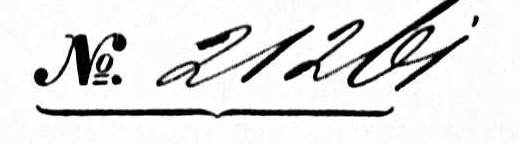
No. 21261
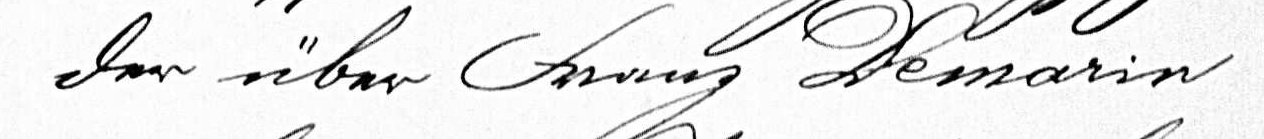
der über Franz Demarin
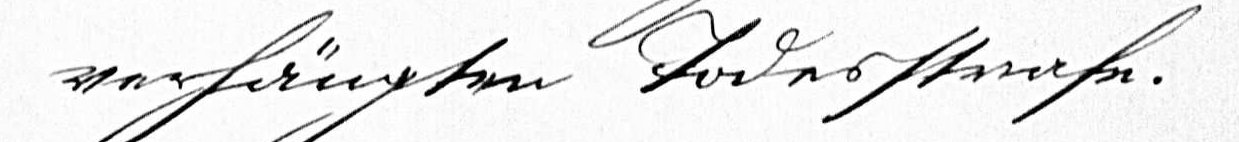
verhängten Todesstrafe.
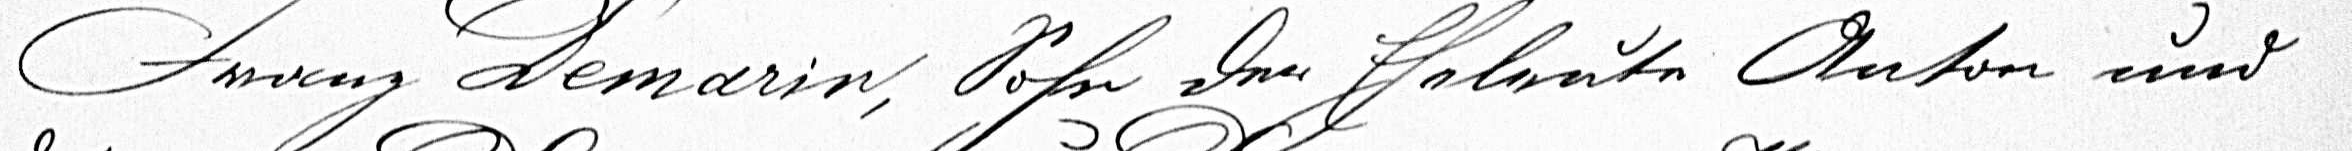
Franz Demarin, Sohn der Eheleute Anton und
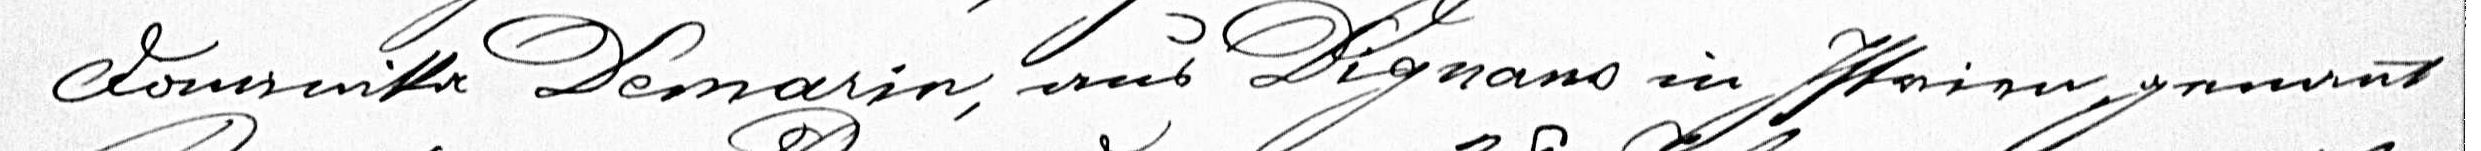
Dominika Demarin, aus Dignano in Istrien, genant
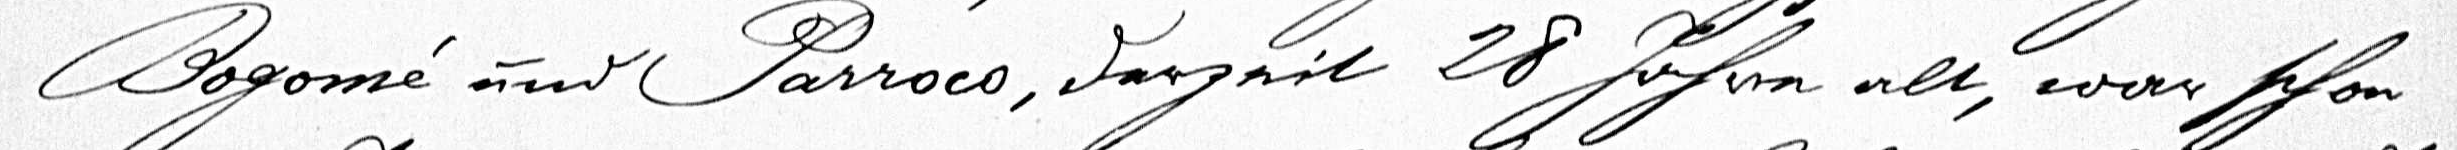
Bogomé und Parroco, derzeit 28 Jahre alt, war schon
